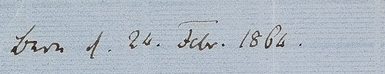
Bern d. 24. Febr. 1864.
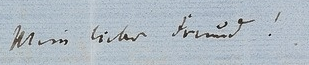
Mein lieber Freund!
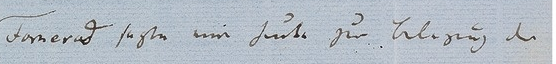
Fornerod sagte mir heute zur Belegung der
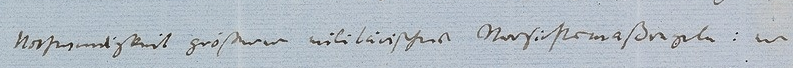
Nothwendigkeit größerer militärischer Vorsichtsmaßregeln: er
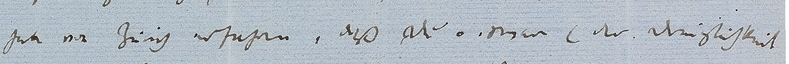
habe von Zürich erfahren, daß Du &. zwar (der Dringlichkeit
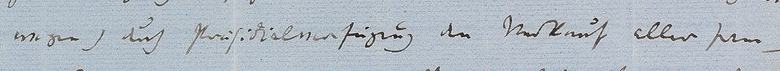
wegen) durch Präsidialverfügung den Verkauf aller frem-
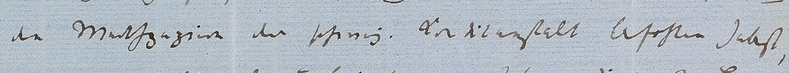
den Werthpapiere der schweiz. Kreditanstalt befohlen habest,
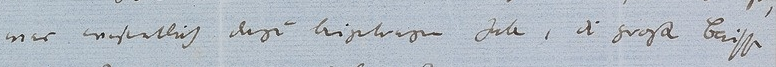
was wesentlich dazu beigetragen habe, die große Baisse
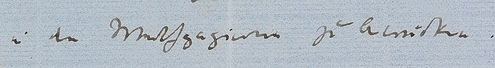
in den Werthpapieren zu bewirken.
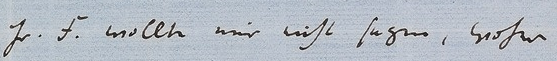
Hr. F. wollte mir nicht sagen, woher
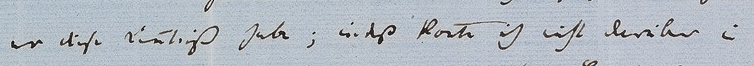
er diese Kenntniß habe; indeß konnte ich nicht darüber in
